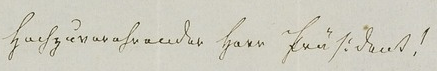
Hochzuverehrender Herr Präsident!
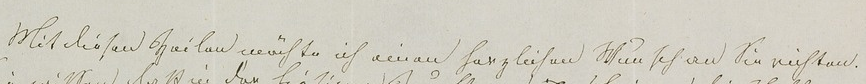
Mit diesen Zeilen möchte ich einen herzlichen Wunsch an Sie richten.
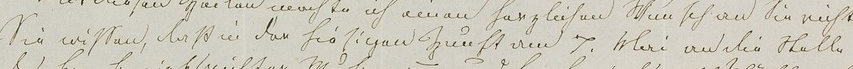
Sie wissen, daß in der hiesigen Zunft am 7. Mai an die Stelle
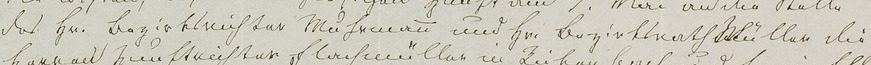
des Hr. Bezirksrichter Wuhrmann und Hr. Bezirksrath Müller die
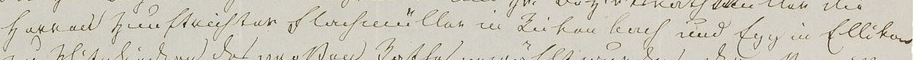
Herren Zunftrichter Flachmüller in Rickenbach und Egg in Ellikon
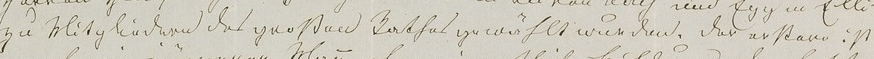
zu Mitgliedern des großen Rathes gewählt wurden. Der erstere ist
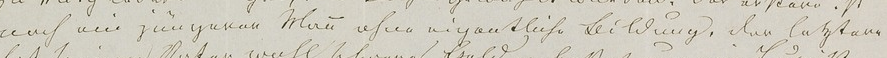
noch ein jüngerer Mann ohne eigentliche Bildung. Der letztere
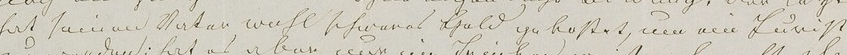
hat seinen Vater wohl schweres Geld gekostet, um ein Jurist
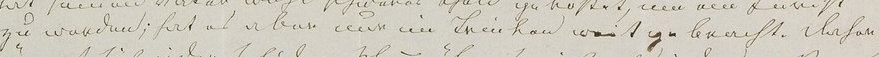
zu werden; hat es aber nur im Trinken weit gebracht. Daher
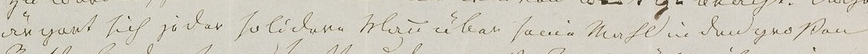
ärgert sich jeder solidere Mann über seine Wahl in den großen
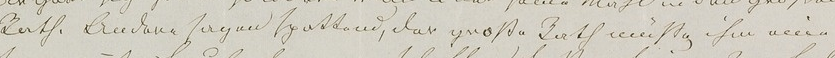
Rath. Andere sagen spottend, der große Rath müße ihm eine
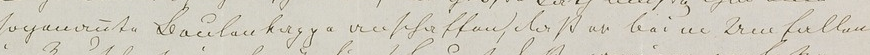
sogenannte Beulenkappe anschaffen, daß er beim Umfallen
